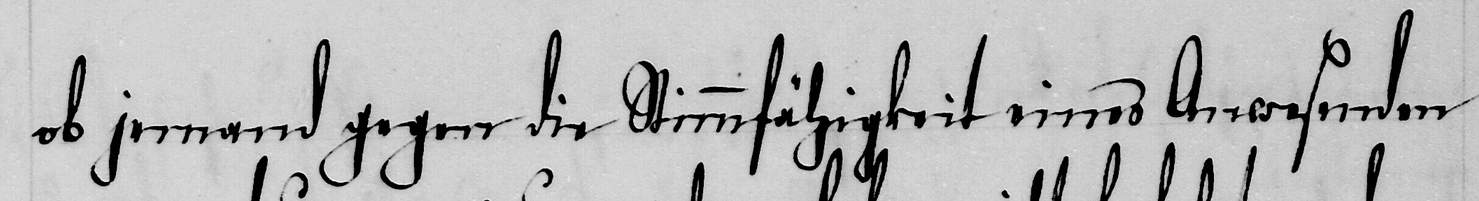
ob jemand gegen die Stimmfähigkeit eines Anwesenden
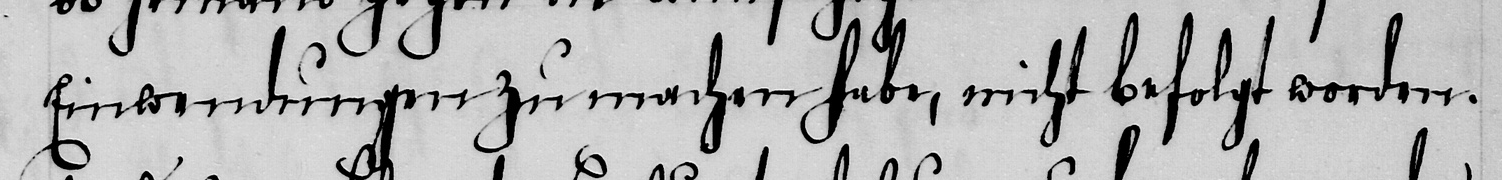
Einwendungen zu machen habe, nicht befolgt worden.
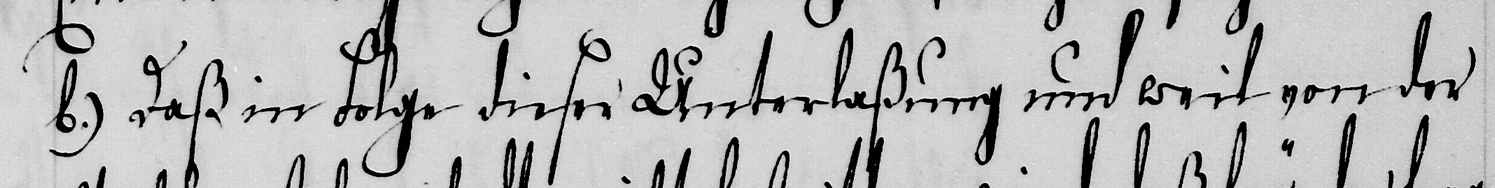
b.) Daß in Folge dieser Unterlaßung und weil von der
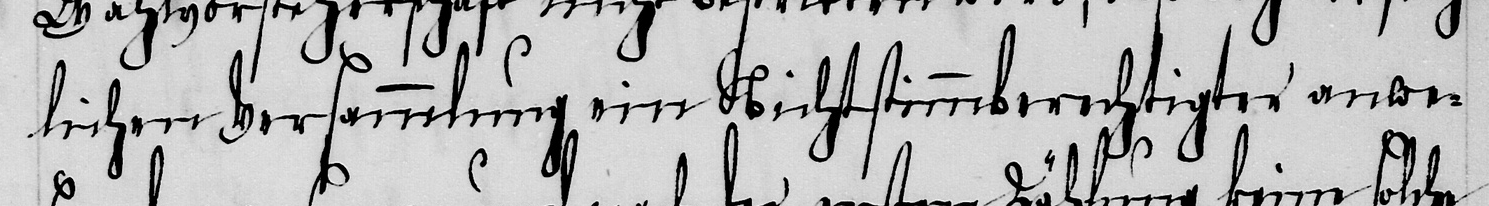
lichen Versammlung ein Nichtstimmberechtigter anwe¬
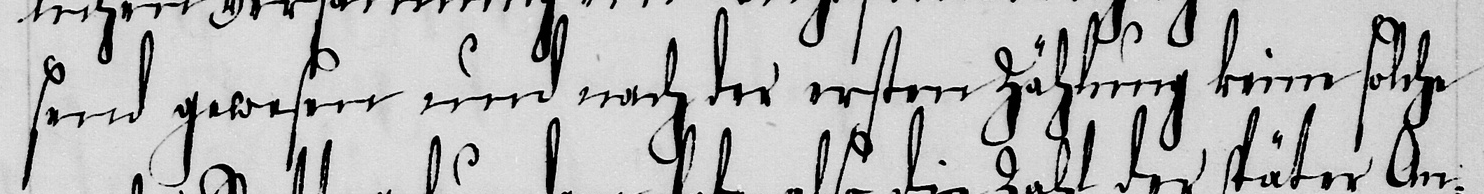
send gewesen und nach der ersten Zählung keine solche
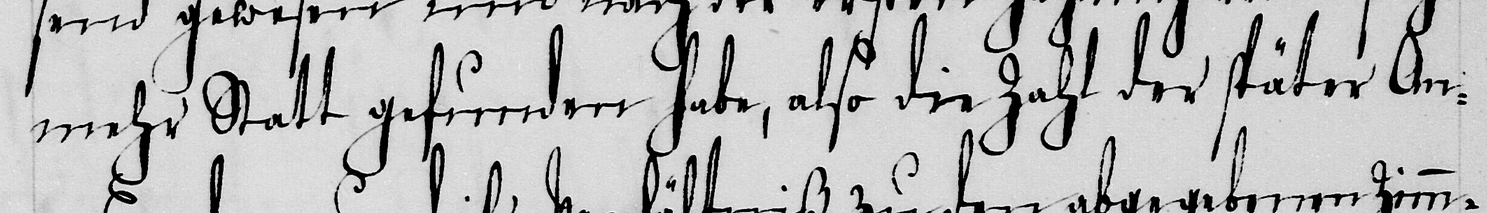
mehr Statt gefunden habe, also die Zahl der später An¬
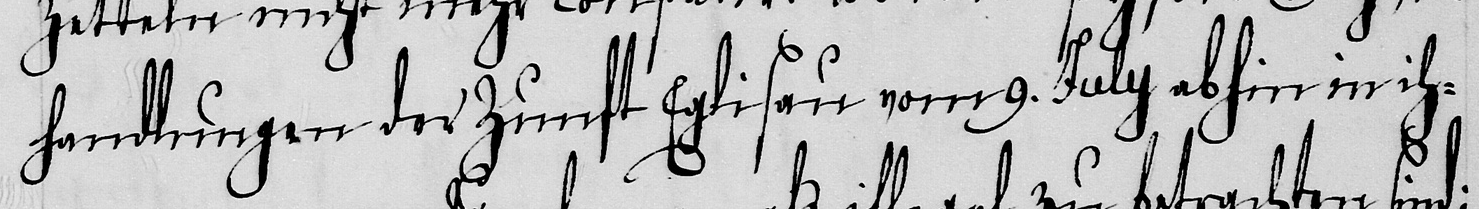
handlungen der Zunft Eglisau vom 9. July abhin in ih¬
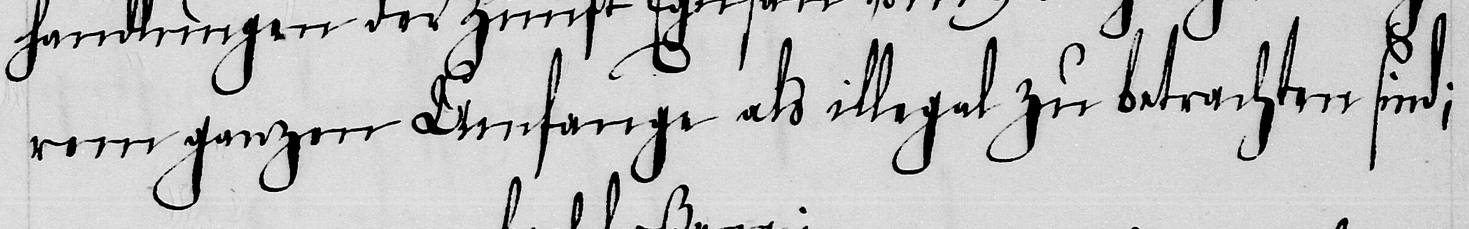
rem ganzen Umfange als illegal zu betrachten sind;
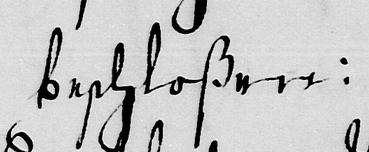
beschloßen:
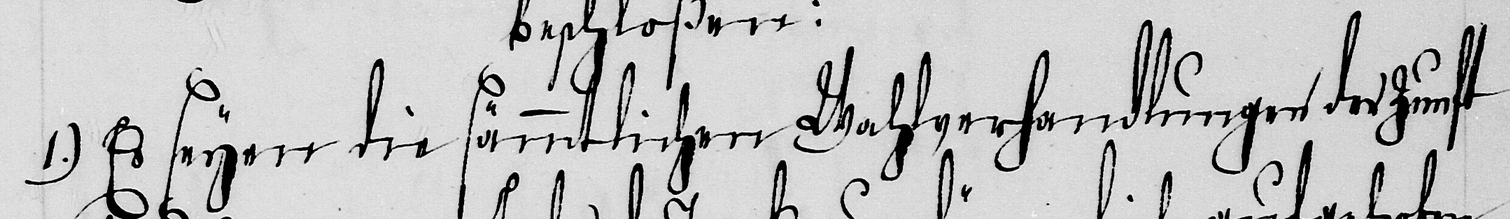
1.) Es seyen die sämmtlichen Wahlverhandlungen der Zunft
